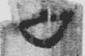古（故）
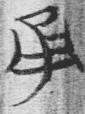甬（用）
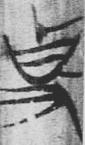史（使）
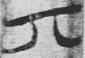亓（其）
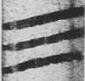三
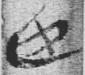臣
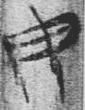母
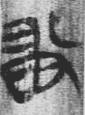敢
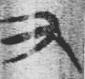又（有）
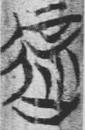○（遲）
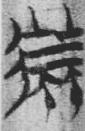速
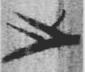之
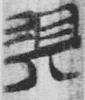○（期）
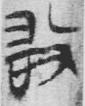敢
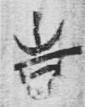告
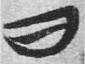日
